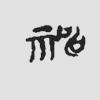神
